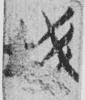○（郤）
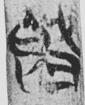既
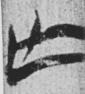亡
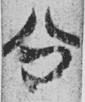公
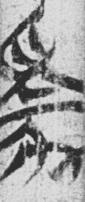家
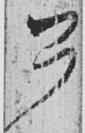乃
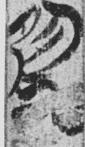溺（弱）
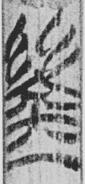鑾（欒）
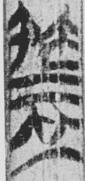箸（書）
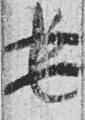弋（弒）
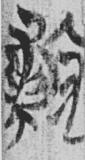○（厲）
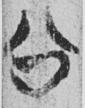公
